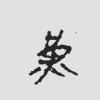黃
